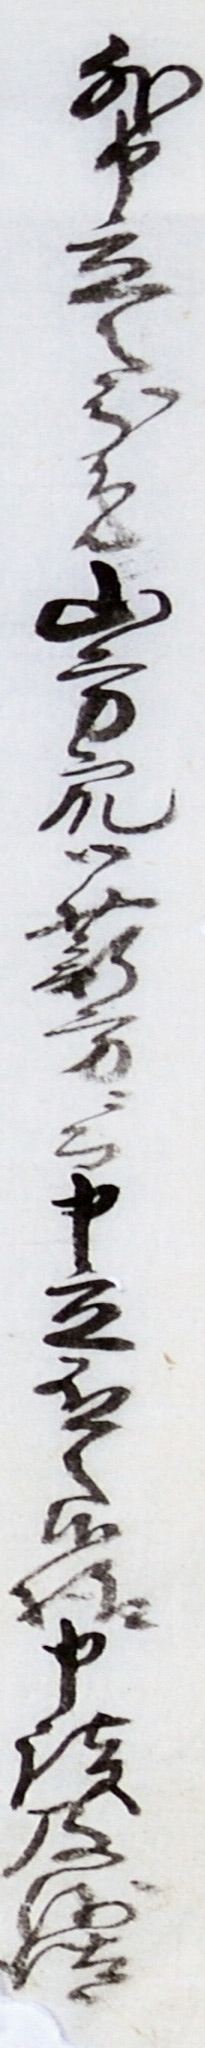外申立之分は山方衆御薪方ニ而申立有之候様申談及沙汰候
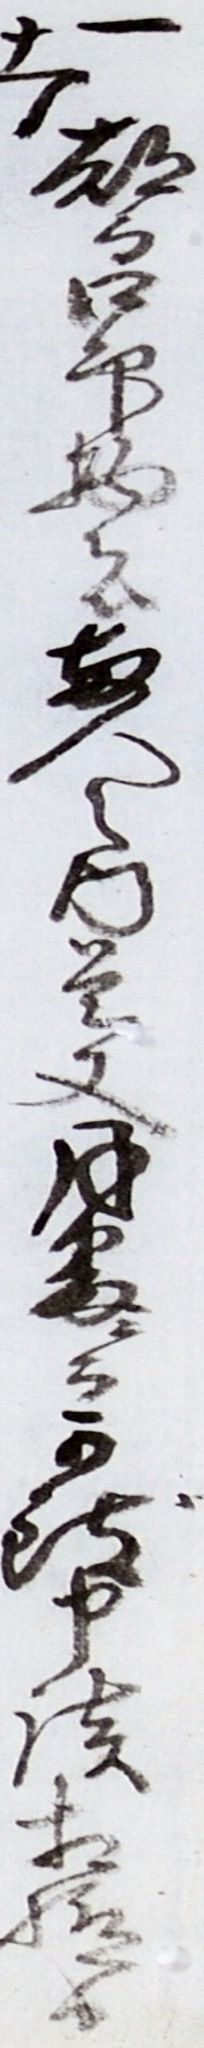一都而口印物は両人之内是又月番ニ而可致申談相極候
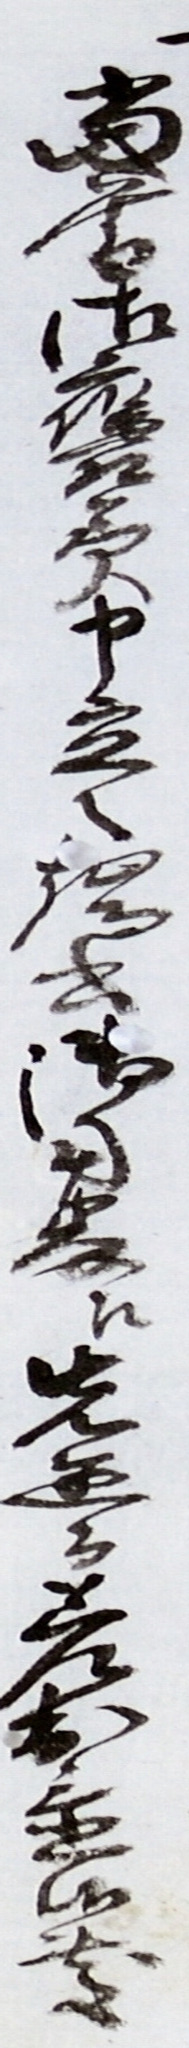一当御褒美申立之端書御用番江先達而差出置候処
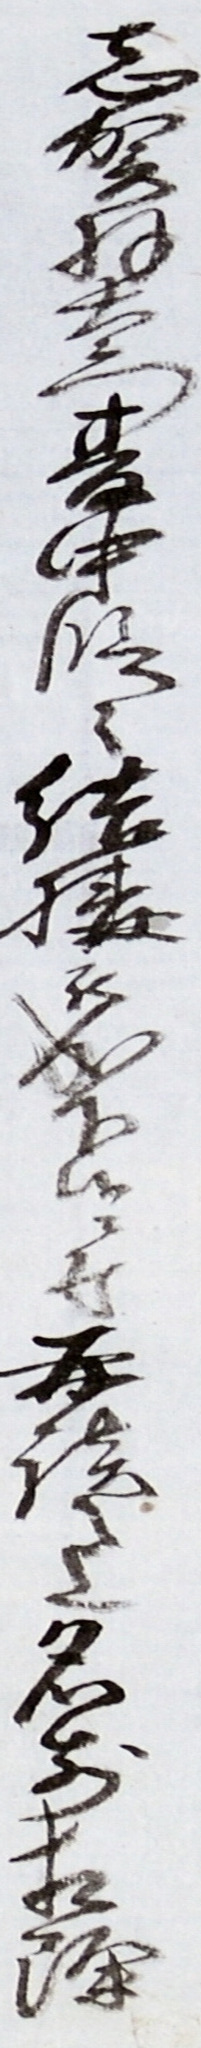一志賀羽右衛門春中段々結構被成下候ニ付再談之上名前相除
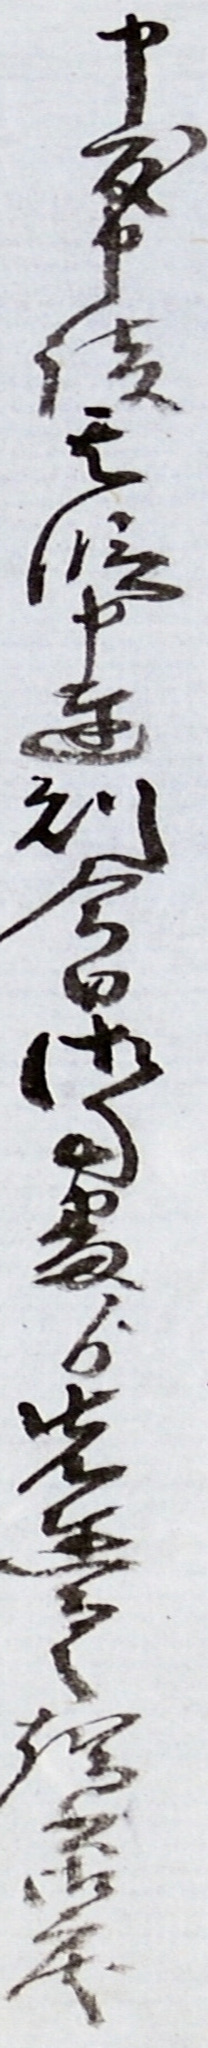申度申談其段申達則今日御用番より先達而之端書御戻
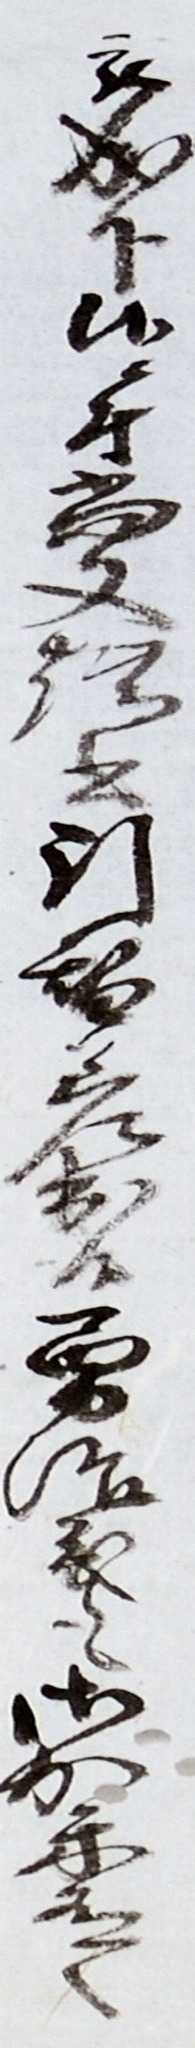被成下候ニ付尚又証書引替差出候勇治義も御加米有之
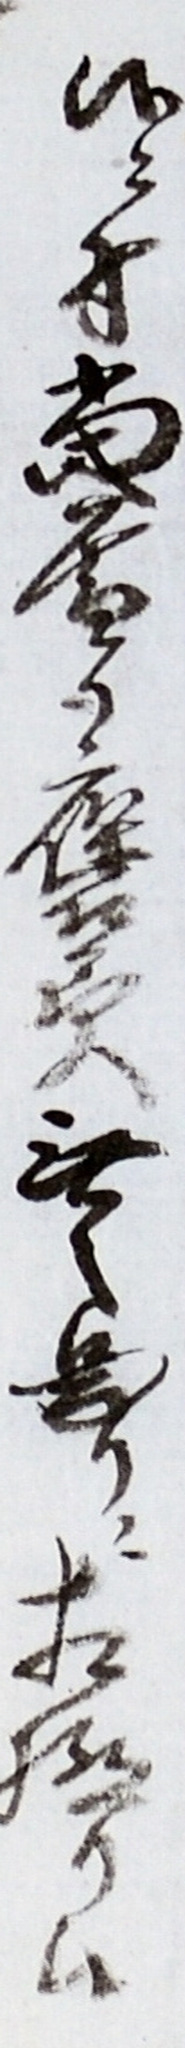候ニ付当番御褒美無之図りニ相極り候
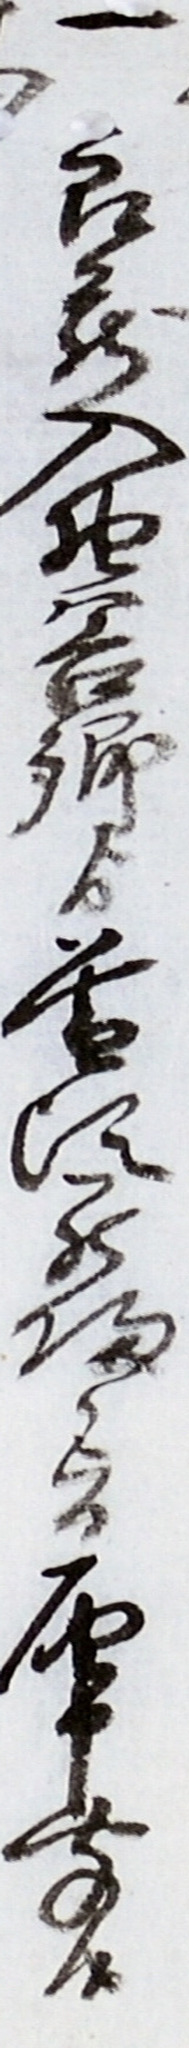一良蔵入野谷郷より次罷帰候旨届申聞候
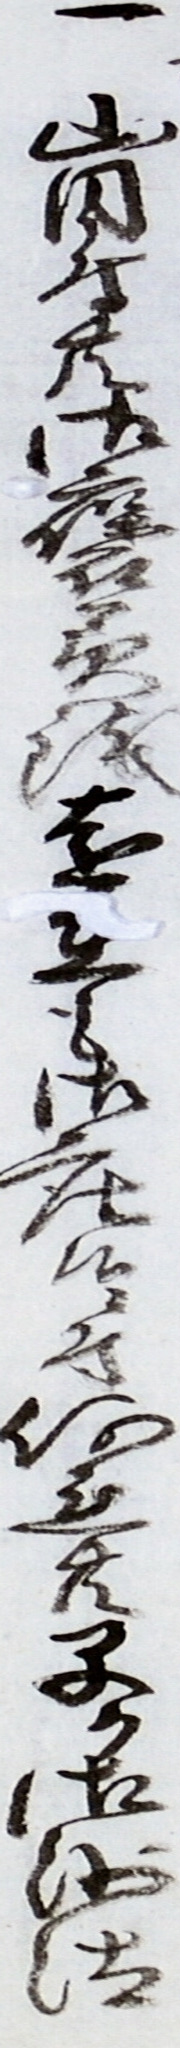一山目付共御褒美銭遠在も御座候ニ付何れ共早ク御沙汰
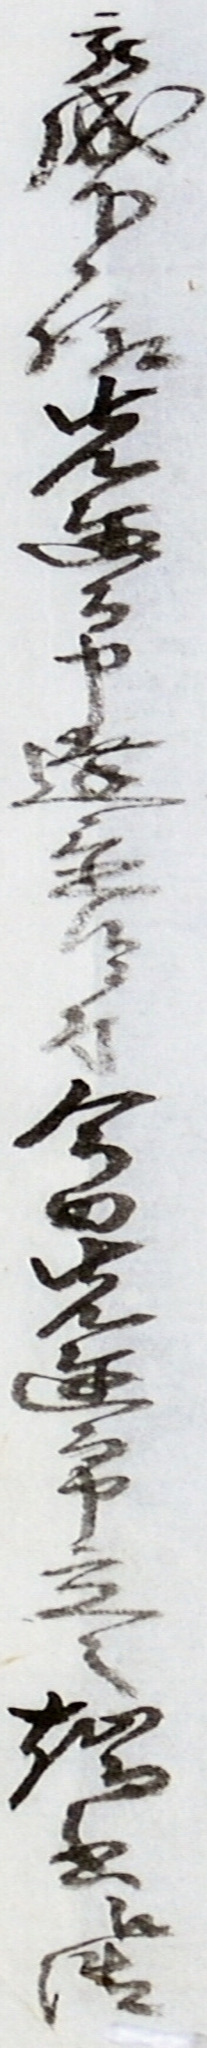罷越下候様先達而申達置候ニ付今日先達而申立之端書江請
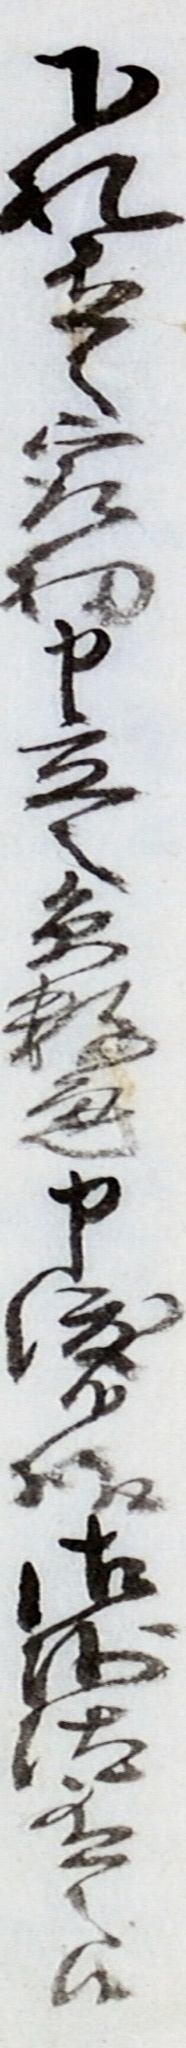下札有之最初申立之員数通申渡候様御沙汰有之候
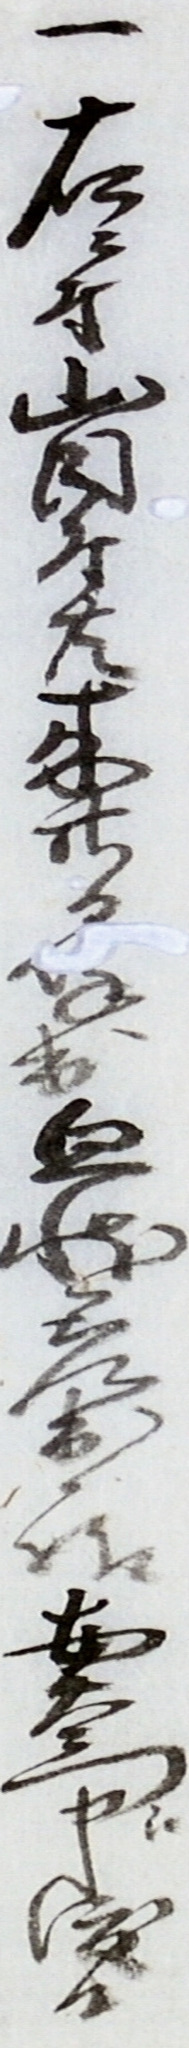一右ニ付山目付共来廿日呼出廻状差出候様安右衛門申渡候
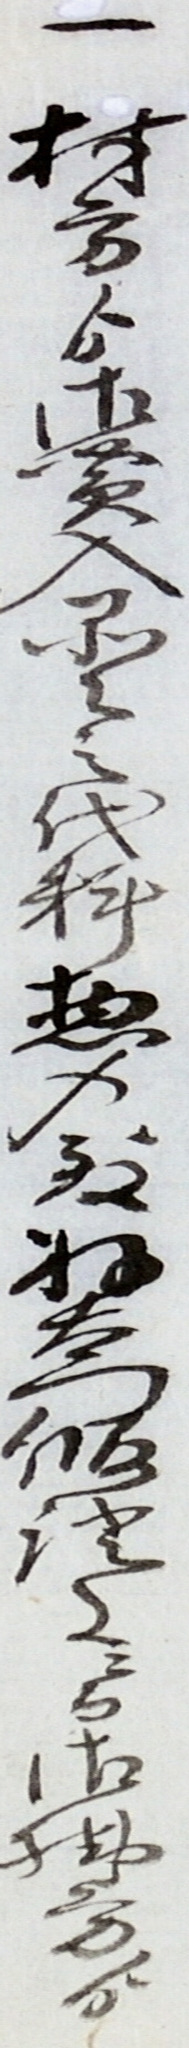一村方より御買入品々之代料惣〆敷羽右衛門仮証文ニ而御払方より
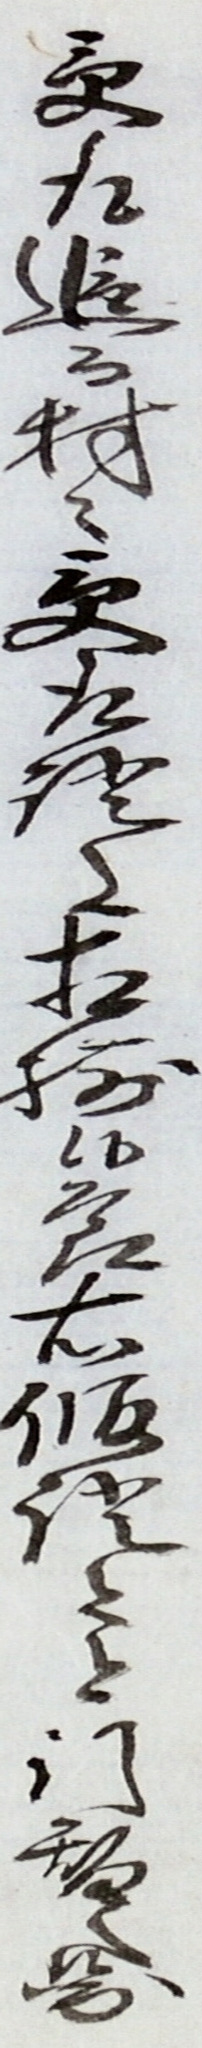受取追而村々受取証之相揃候節右仮証文を引替之図
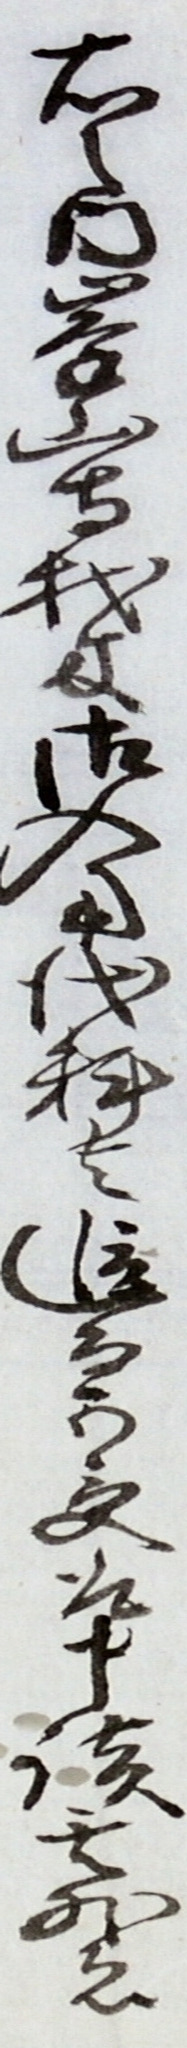右之内峯山守材木御入用代料は追而可受取申談其外は
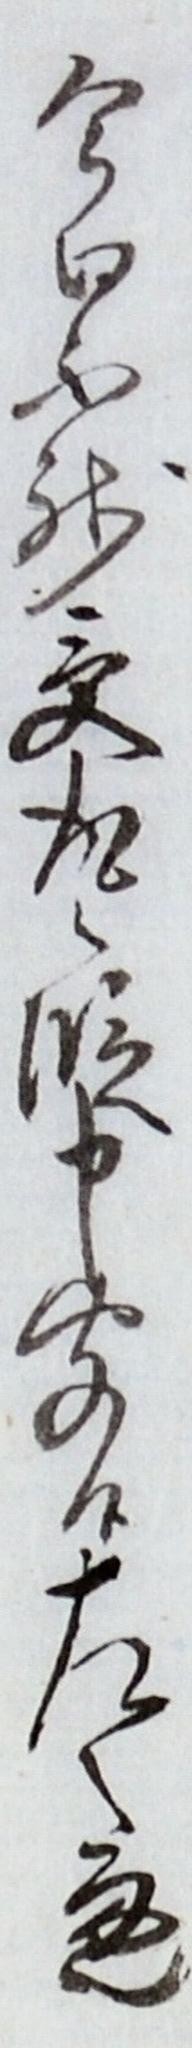今日不残受取候段申聞候左之通
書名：御山奉行御用控
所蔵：伊那市立高遠町図書館・合同会社AMANE
